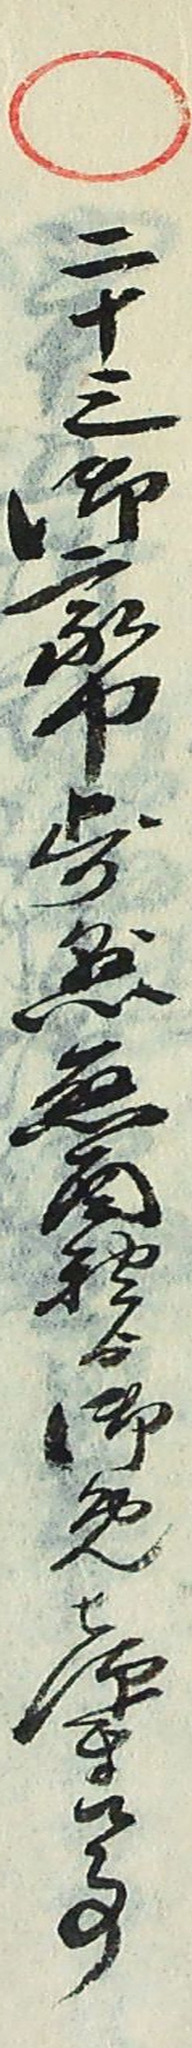朱丸二十三御家中歩懸愈酉秋ゟ御免被仰付候事
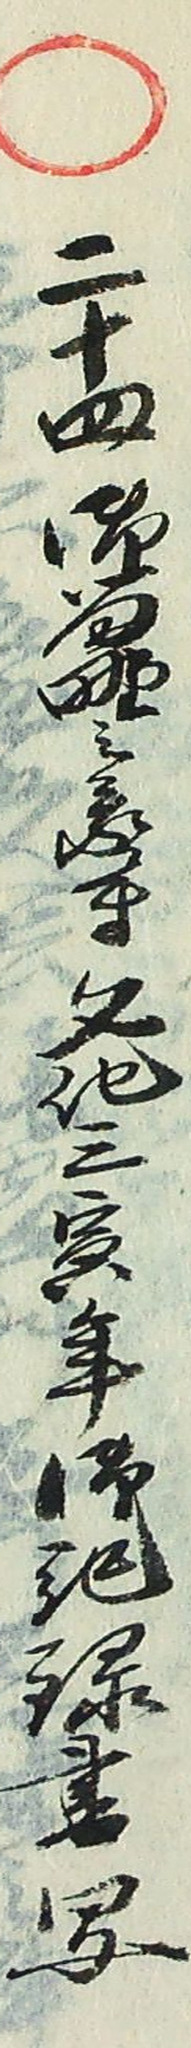朱丸二十四御留野之義ニ付文化三寅年御記録書写
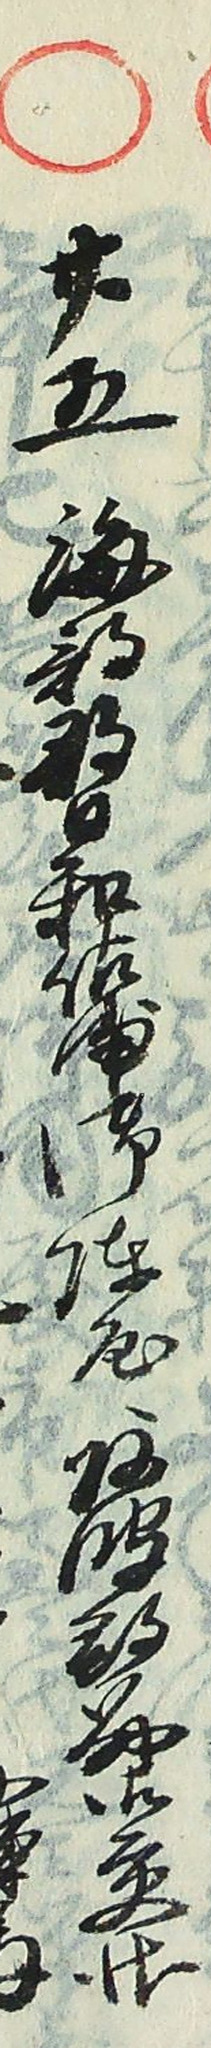朱丸廿五海部郡日和佐浦御陣屋へ阿波郡筋御交仕
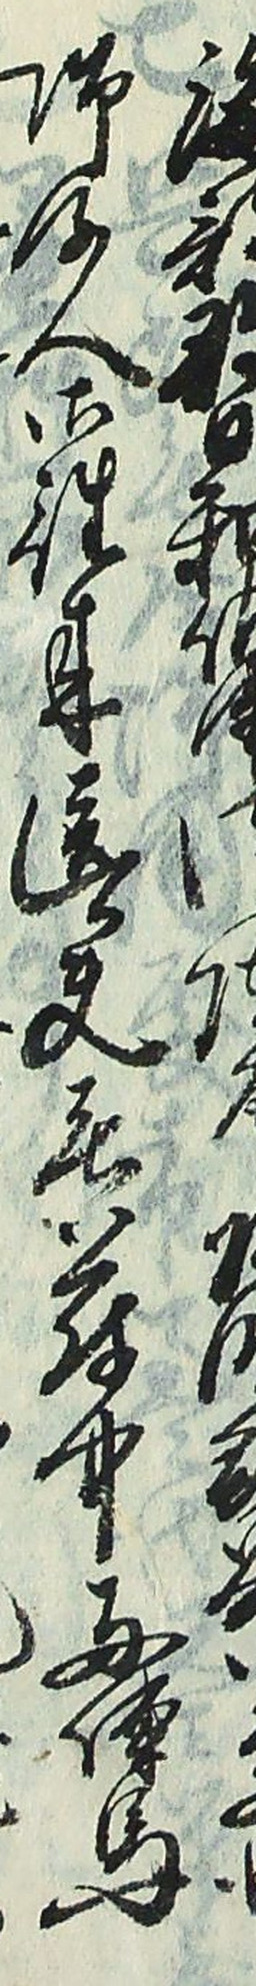御役人御往来送り夫庄苻中両傳馬
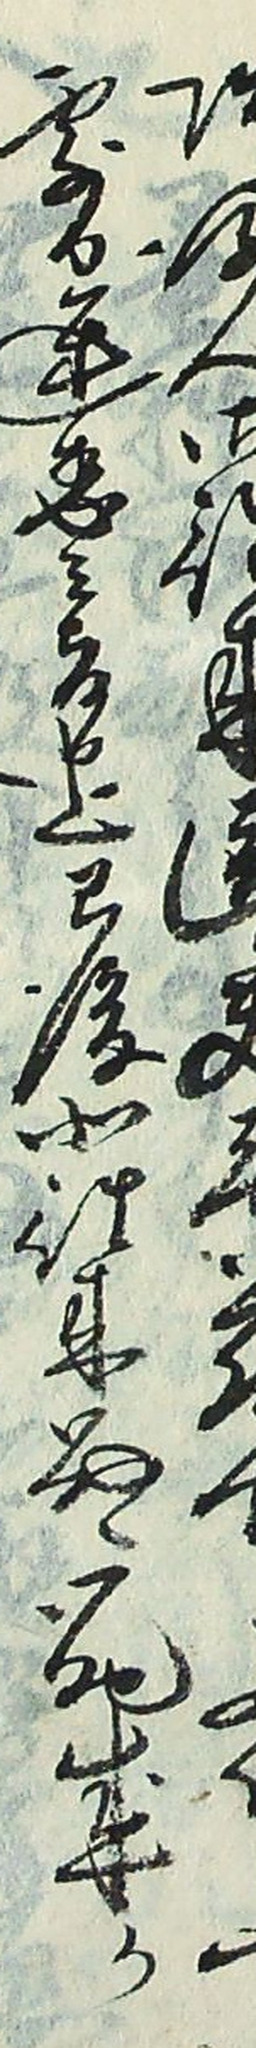處ゟ迷惑之旨申上已後北往来筋へ罷成り
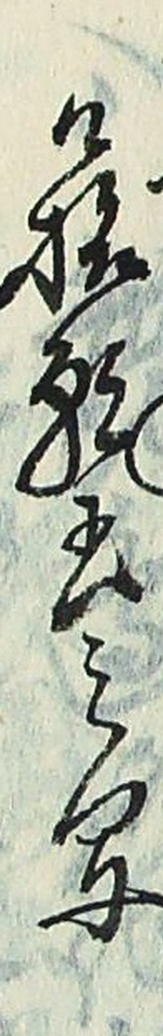候様願書之写

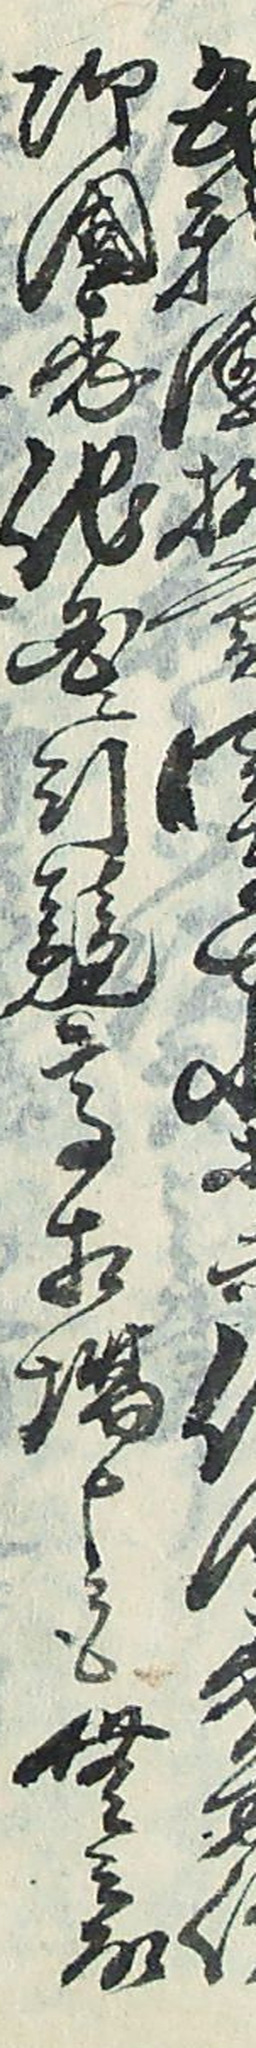御国表他国ニ引競高相場申候にも無之故
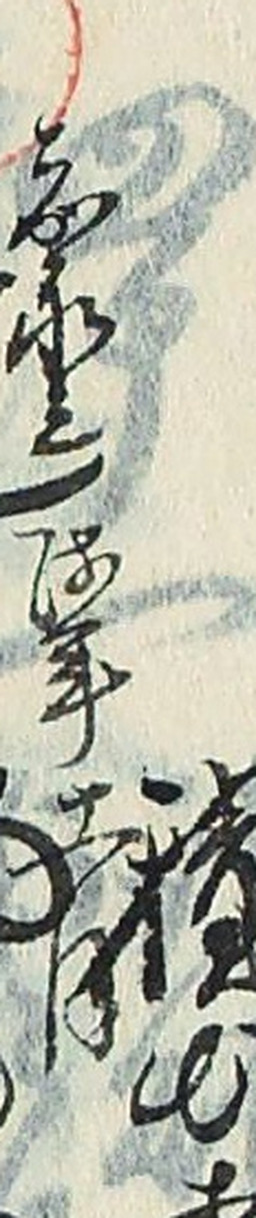嘉永三戌十一月
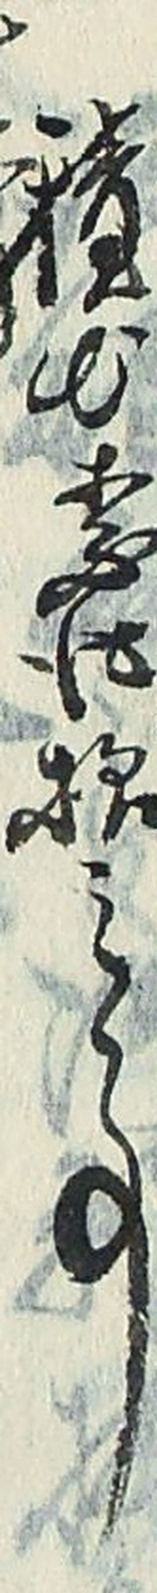積出等不仕様之事
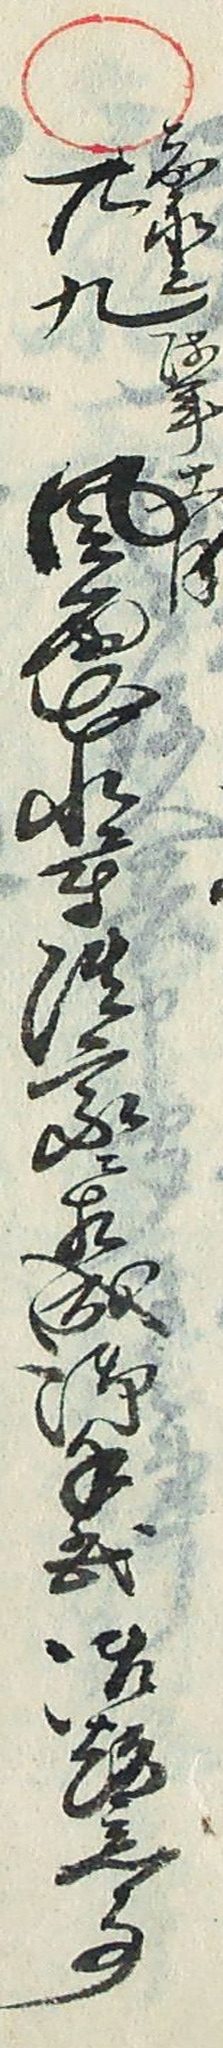朱丸廿九風雨出水ニ付潰家ニ相成御手當御趣意事
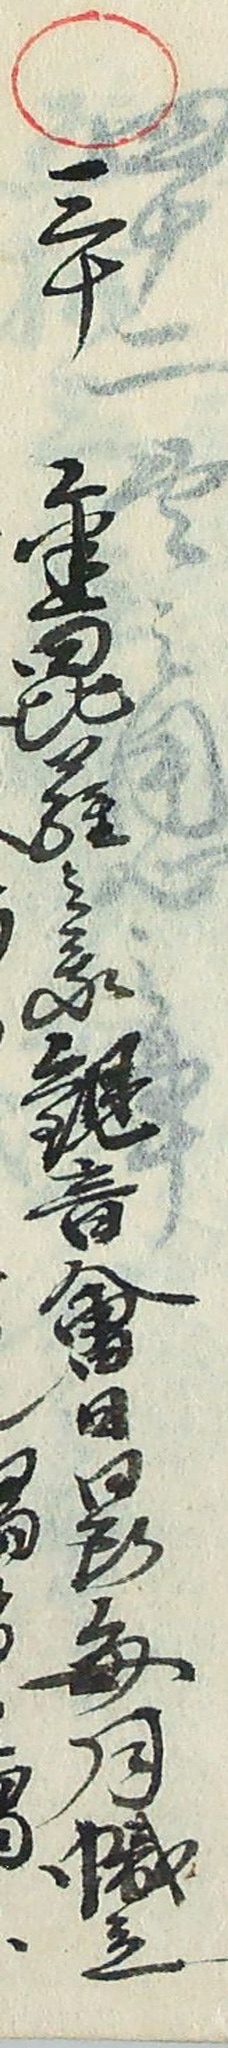朱丸三十金毘羅之義観音會日同所毎月幟立
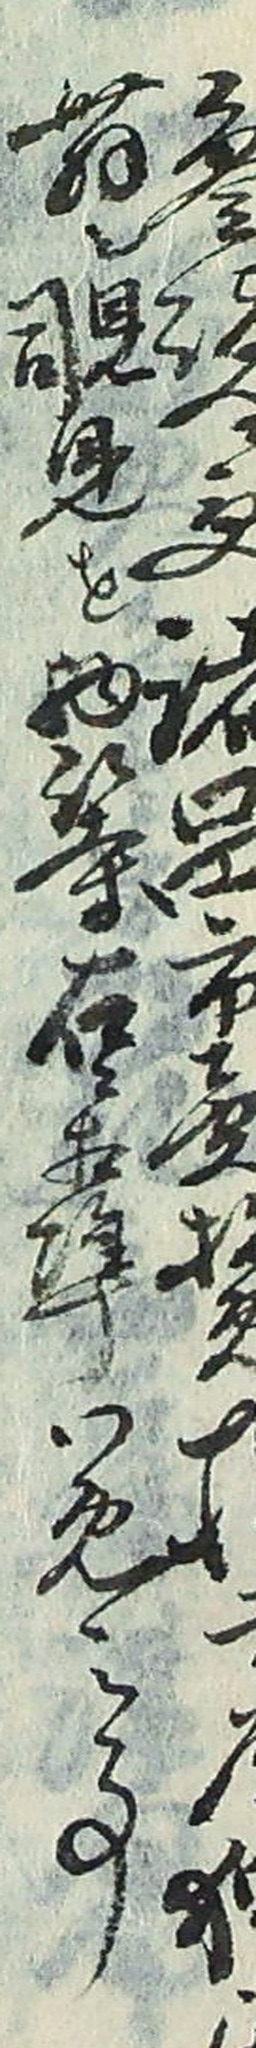舞を覗見せ物等右ニ相準御免之事
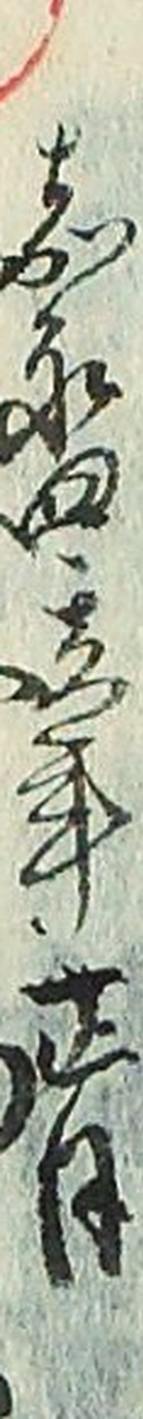嘉永四亥年正月
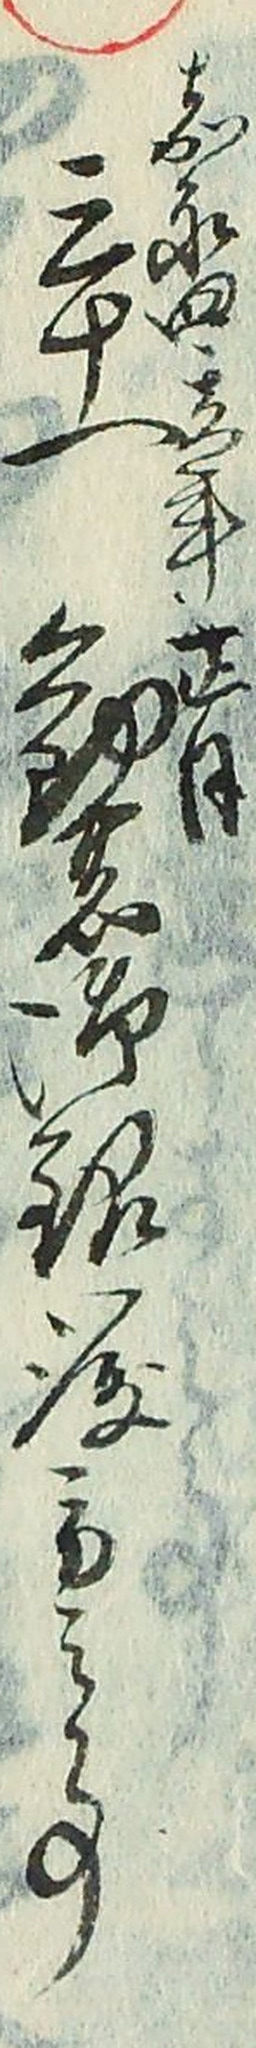朱丸三十一勧農御銀御渡方之事
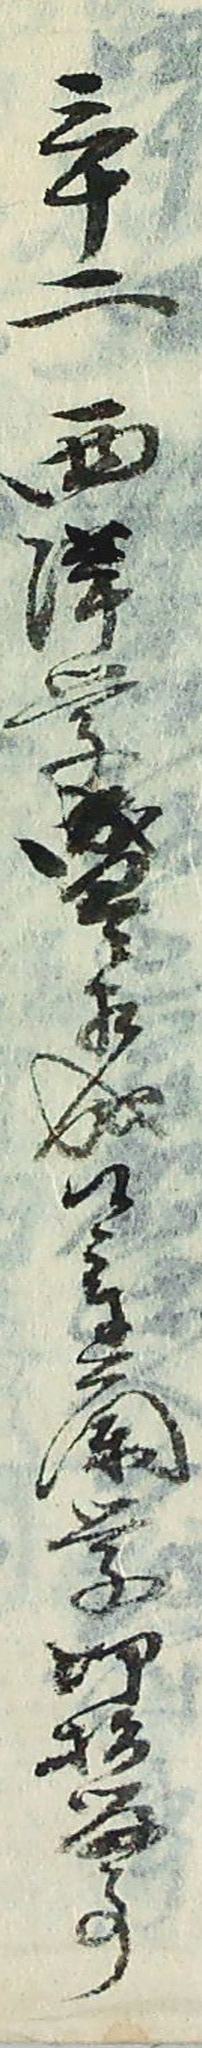三十二西洋学盛ニ相成候ニ付蘭学御指留事
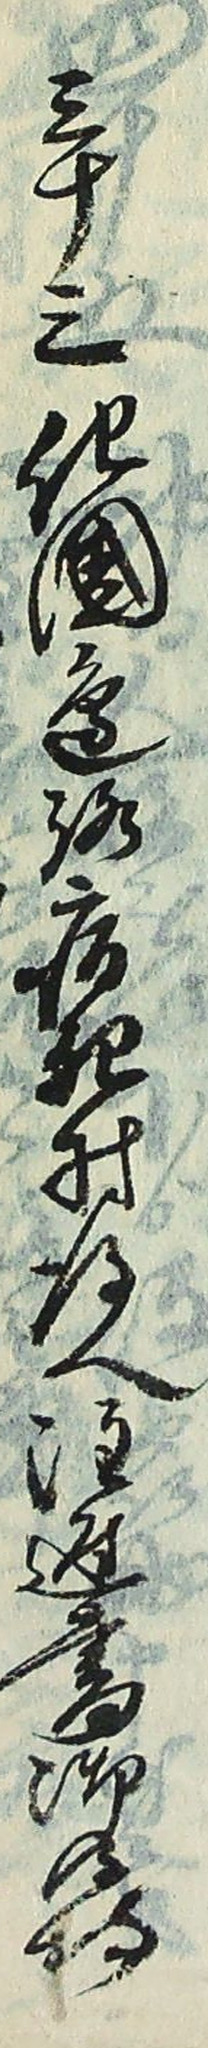三十三他國邊路病死村役人注進書御役場
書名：諸御趣意書并御下知向之写
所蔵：鳴門教育大学 Naruto University of Education
